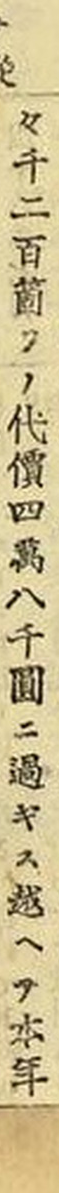々千二百箇ソノ代價四萬八千圓ニ過ギス越ヘテ本年
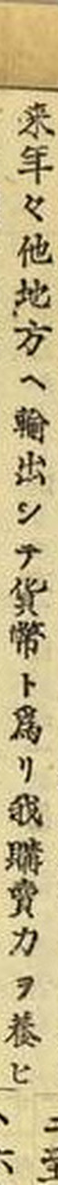来年々他地方ヘ輸出シテ貨幣ト爲リ我購賣力ヲ養ヒ
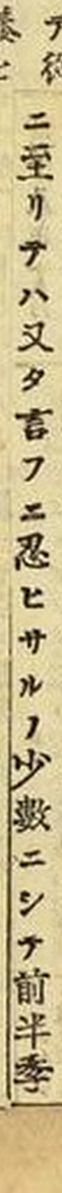ニ至リテハ又タ言フニ忍ヒサルノ少數ニシテ前半季
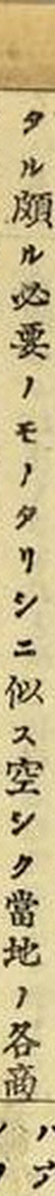タル頗ル必要ノモノタリシニ似ス空シク當地ノ各商
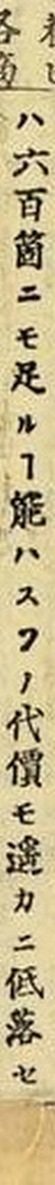ハ六百箇ニモ足ルヿ能ハスソノ代價モ遥カニ低落セ
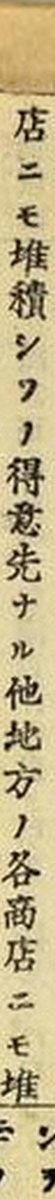店ニモ堆積シソノ得意先ナル他地方ノ各商店ニモ堆
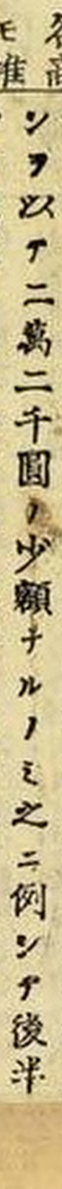シヲ以テ二萬二千圓ノ少額ナルノミ之ニ例シテ後半
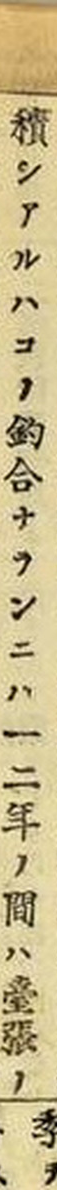積シアルハコノ釣合ナランニハ一二年ノ間ハ壹張ノ
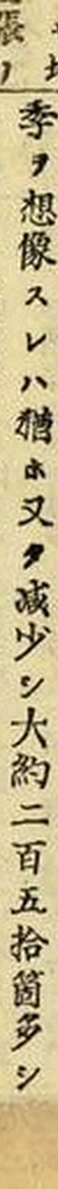季ヲ想像スレハ猶ホ又タ減少シ大約二百五拾箇多シ
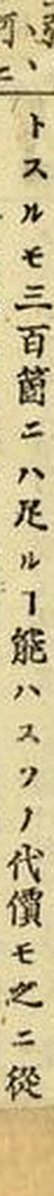トスルモ三百箇ニハ足ルヿ能ハスソノ代價モ之ニ從
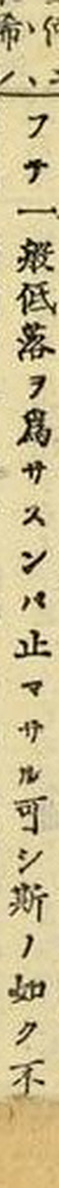フテ一般低落ヲ爲サスンバ止マサル可シ斯ノ如ク不
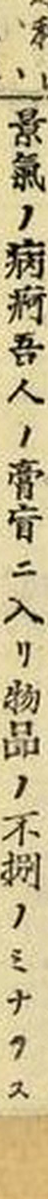景氣ノ病痾吾人ノ膏盲ニ入リ物品ノ不捌ノミナラス
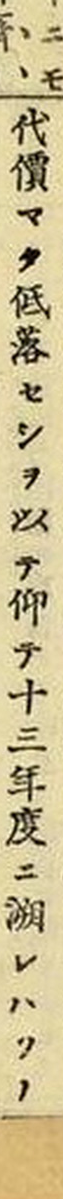代價マタ低落セシヲ以テ仰テ十三年度ニ溯レハソノ
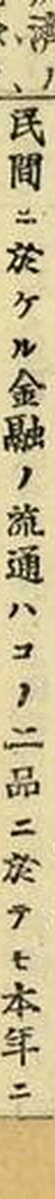民間ニ於ケル金融ノ流通ハコノ二品ニ於テモ本年ニ
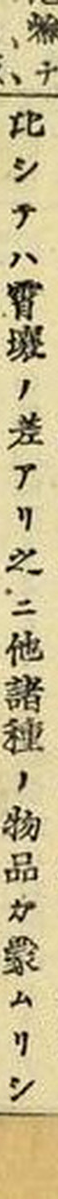比シテハ霄壤ノ差アリ之ニ他諸種ノ物品ガ蒙ムリシ
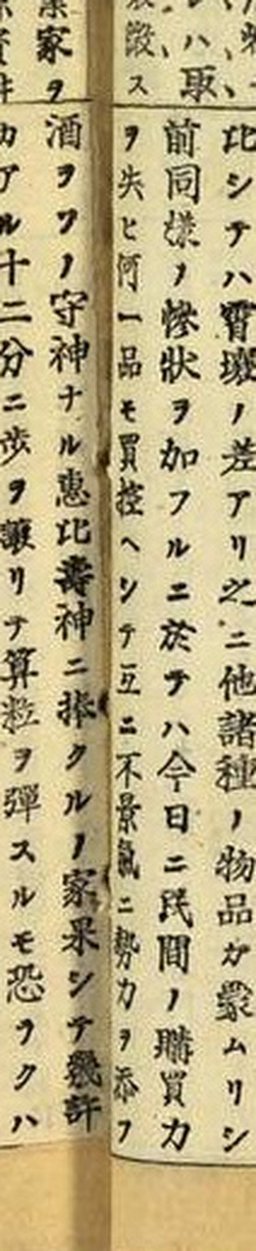ヲ失ヒ何一品モ買控ヘシテ互ニ不景氣ニ勢力ヲ添フ
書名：温古集 五巻
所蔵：福井県文書館 Fukui Prefectural Archives
